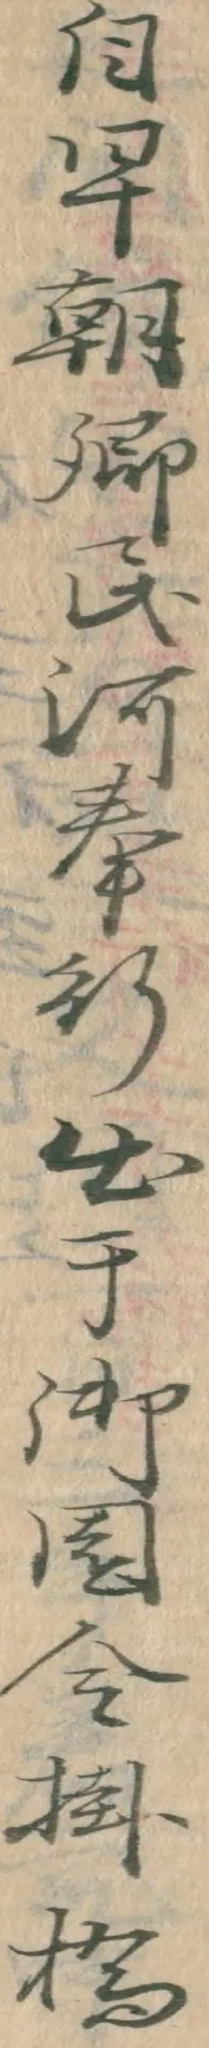自早朝郷民河奉行出于御園令掛橋
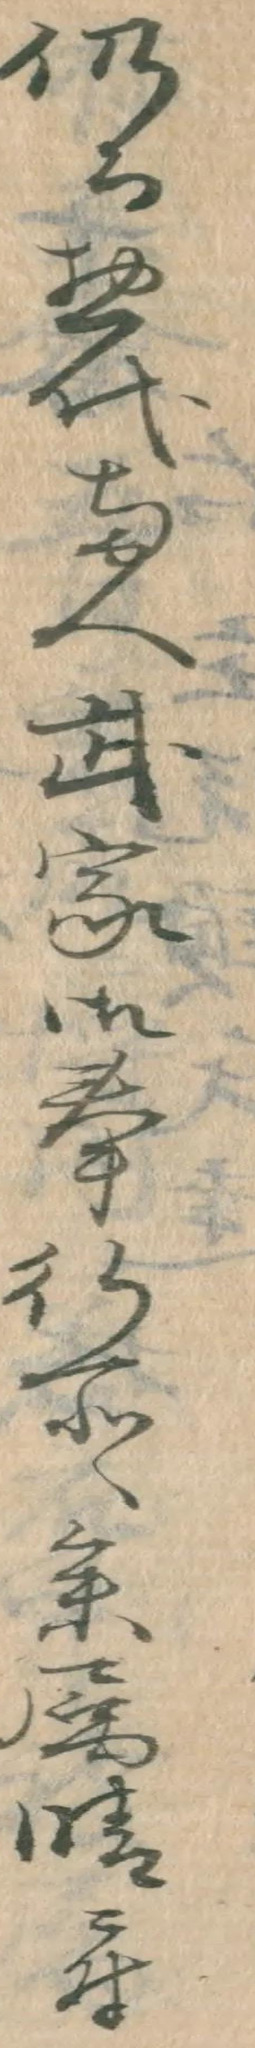仍而惣代両人武家御奉行所へ参属晴ニ付
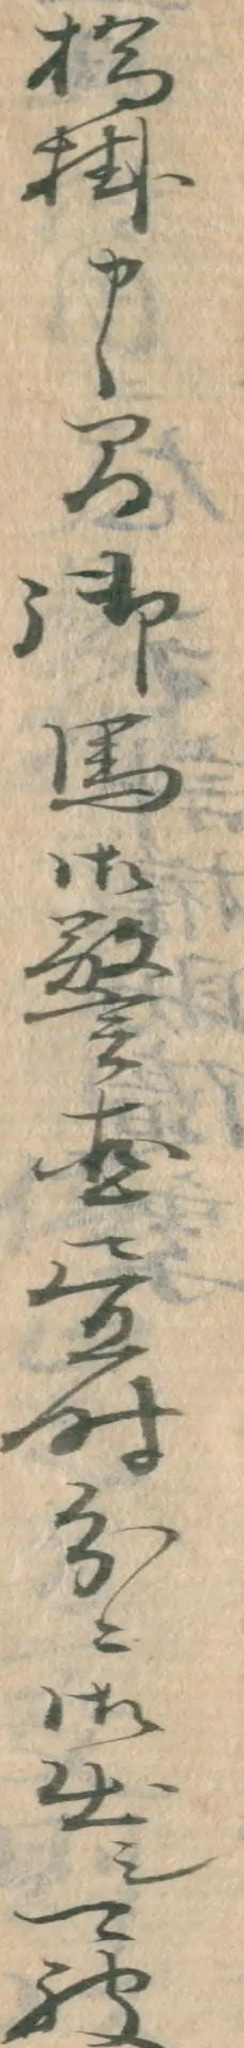橋掛申候間御馬御警固昼時分ニ御出シ可被
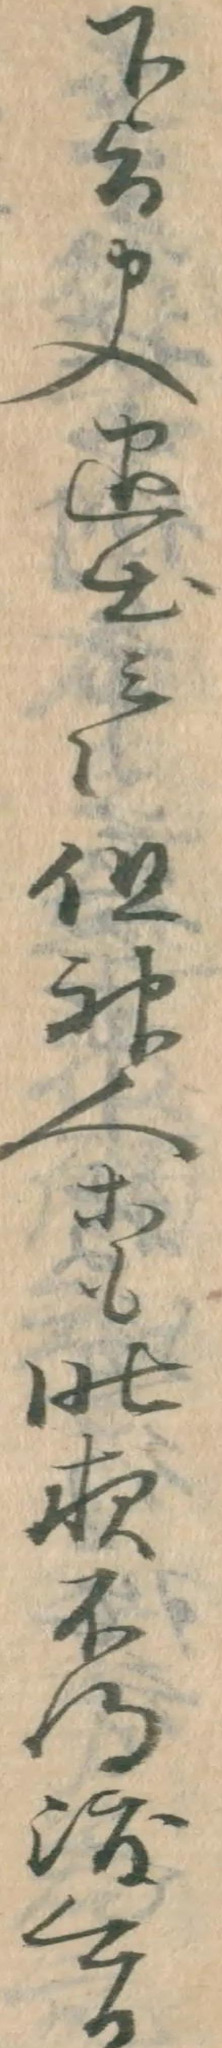下旨申入退出云々但神人等も昨夜不得渡今日
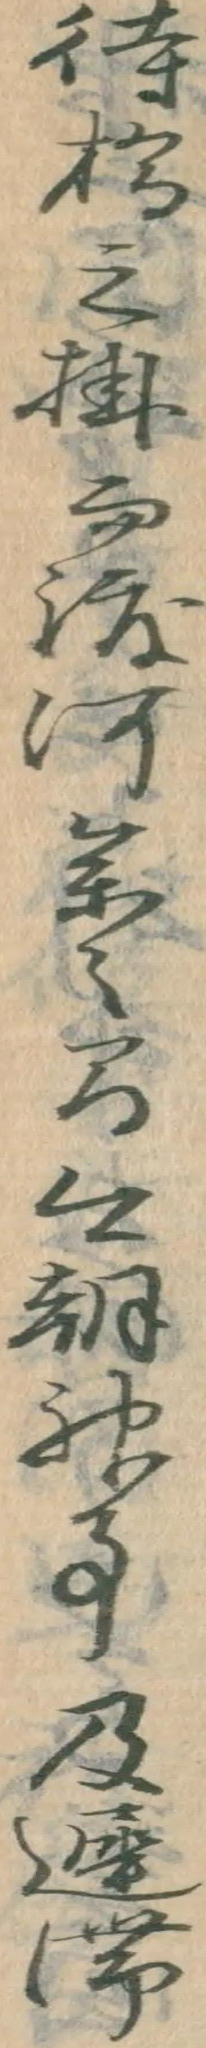待橋之掛而渡河参之間今朝神事及遅滞

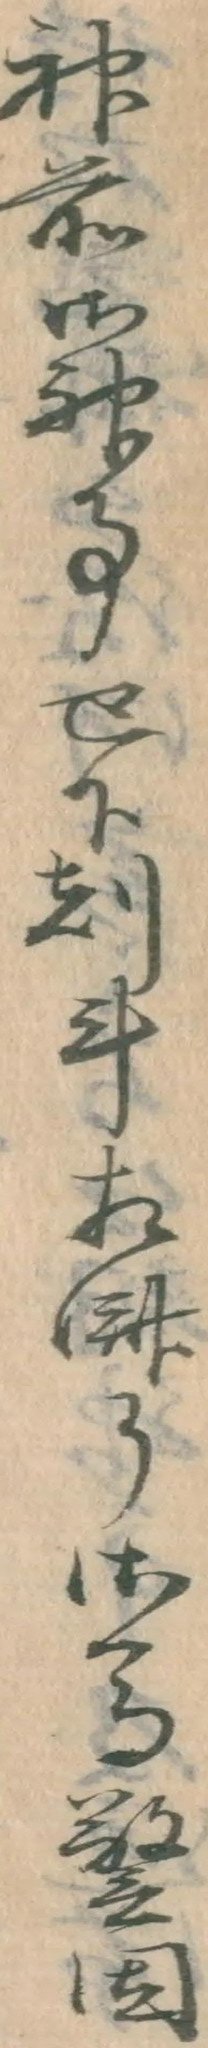神前御神事已下刻計相済了御馬警固
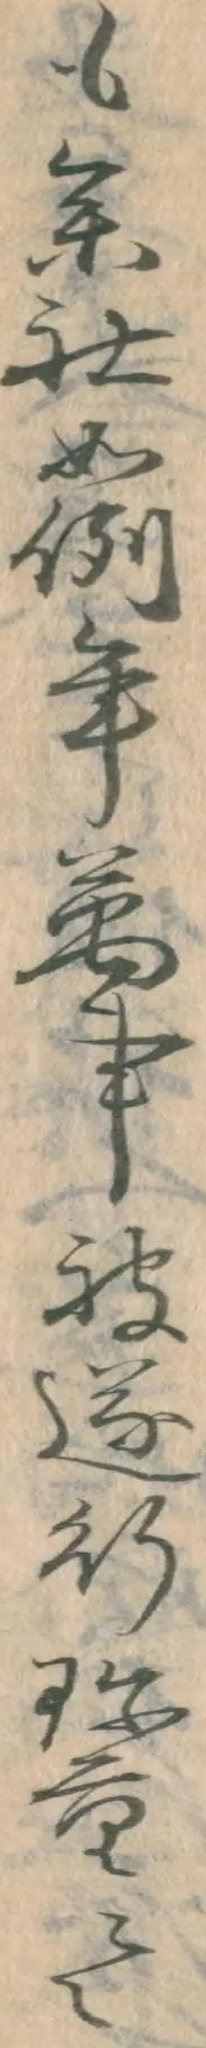も参社如例年万事被遂行珍重云々
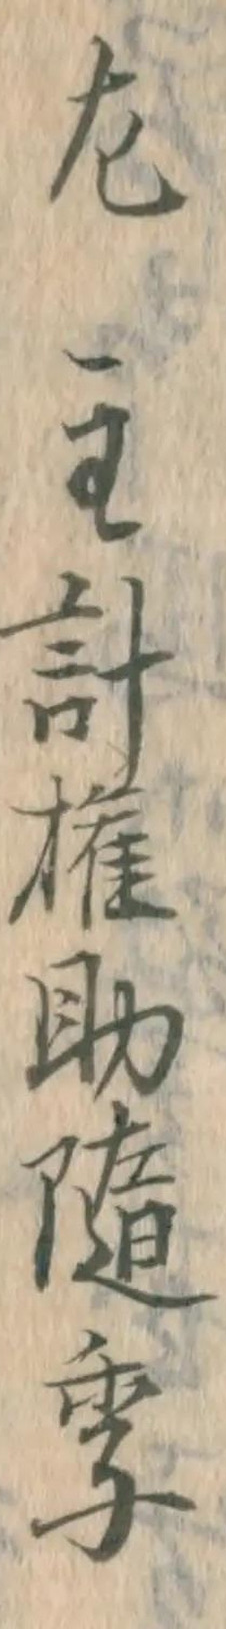左主計権助随季
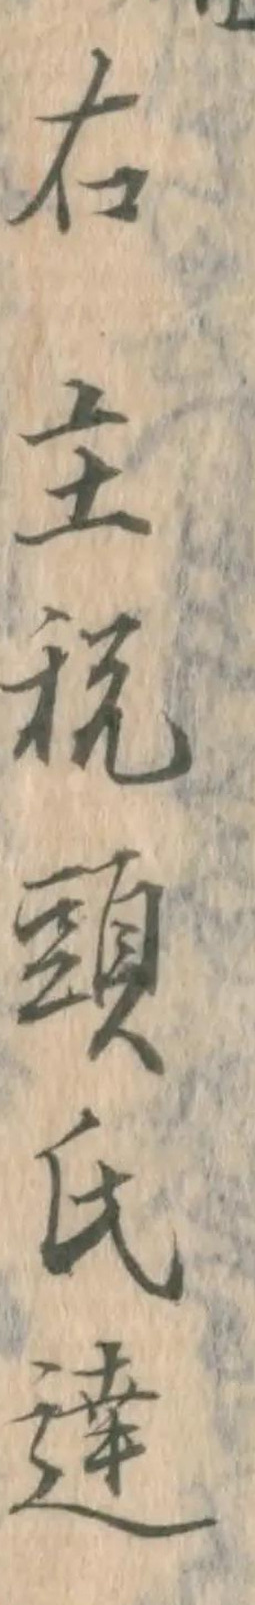右主税頭氏達
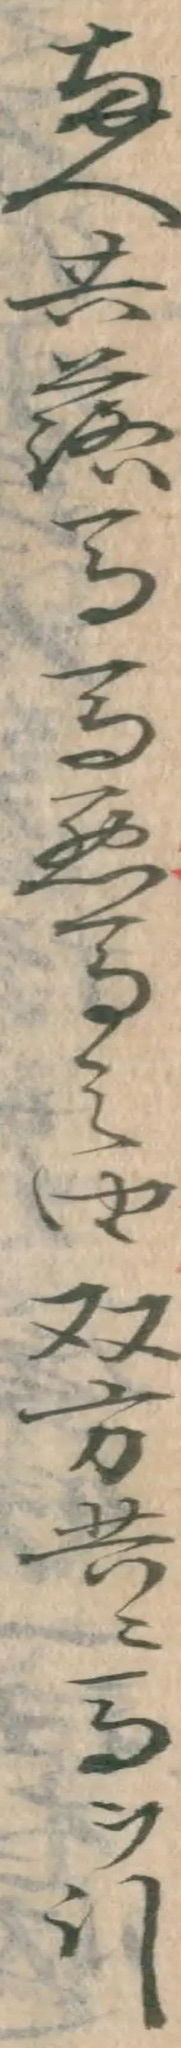両人共落馬馬悪馬之由双方共ニ馬ヲ引
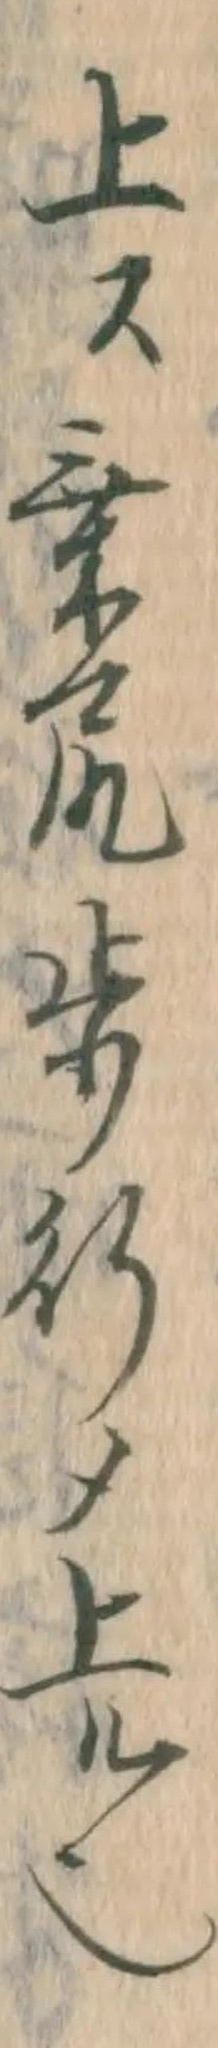上ス乗尻歩行シテ上ル也
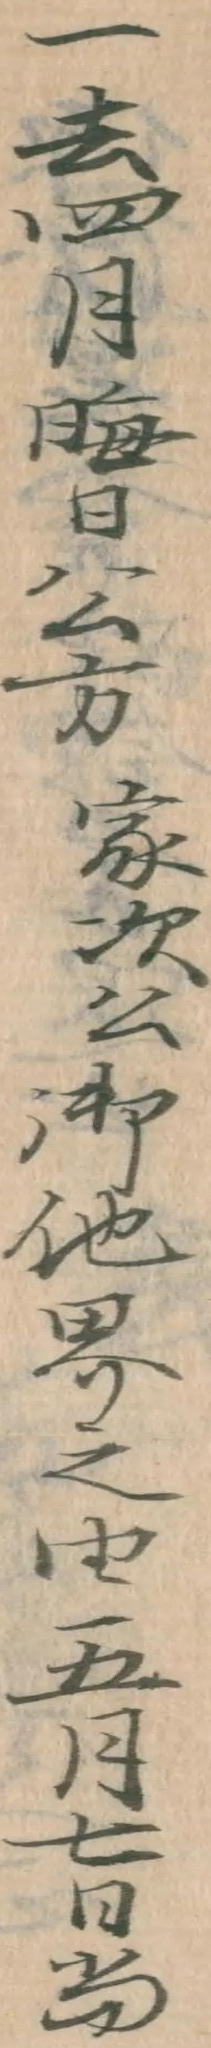一去四月晦日公方家次公御他界之由五月七日当
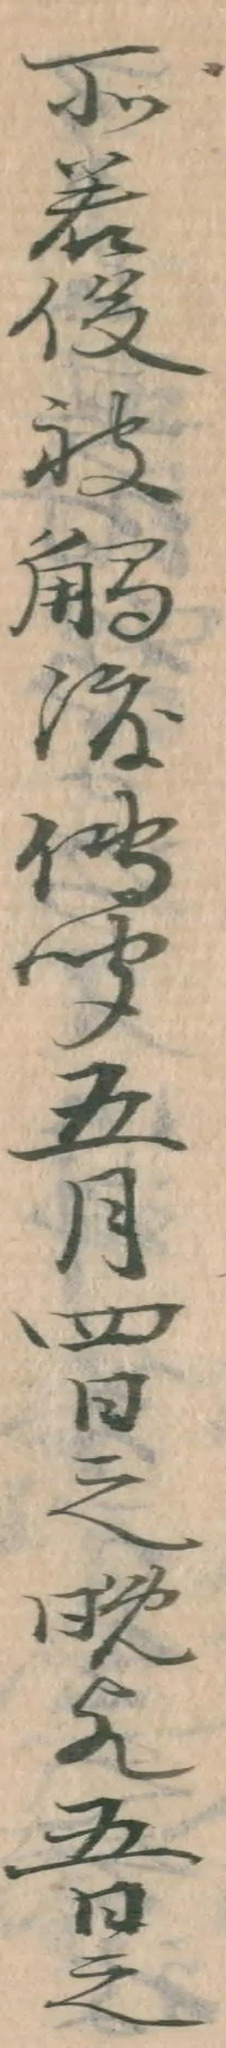所若役被触渡伝聞五月四日之晩歟五日之
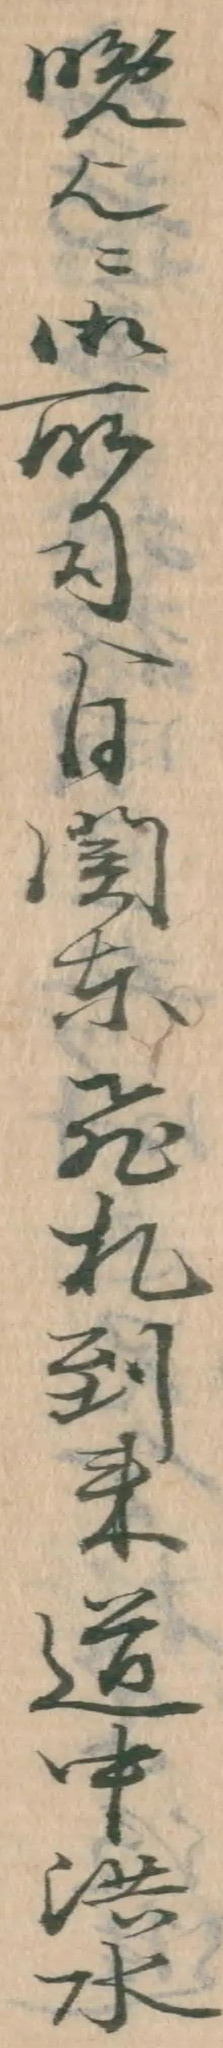晩歟ニ御所司へ自関東飛札到来道中洪水
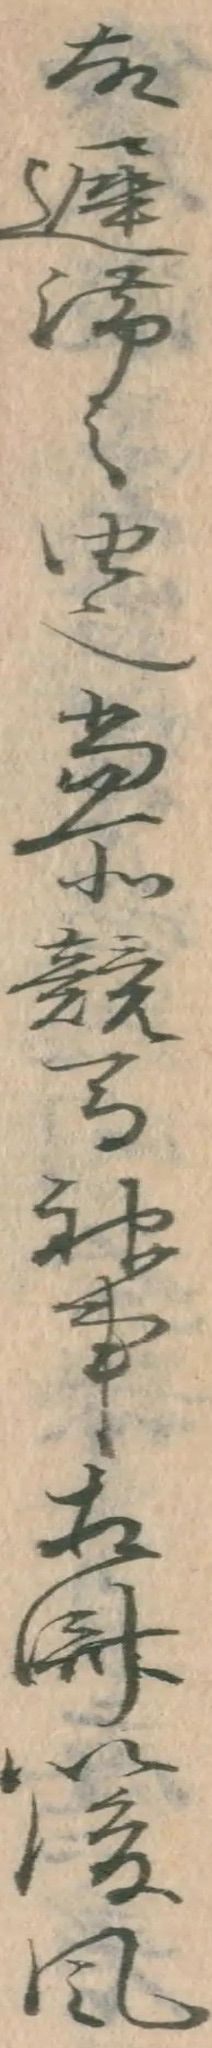故遅滞之由也当所競馬神事相済以後風
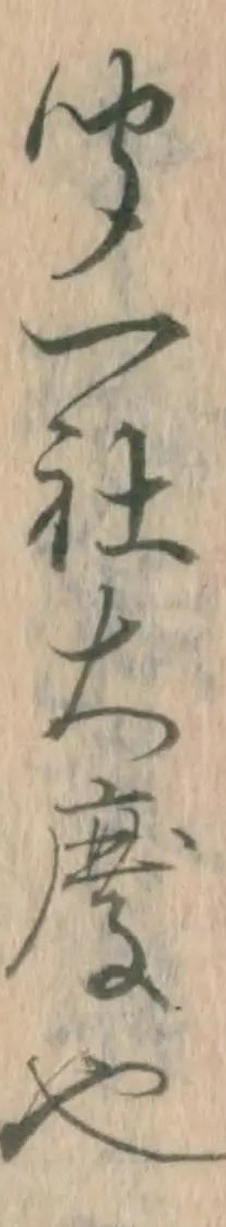聞一社大慶也
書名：賀茂社記録. 第10冊
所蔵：国立国会図書館 National Diet Library, JAPAN
